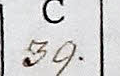39.
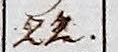22.
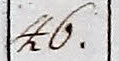46.
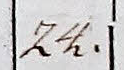24.
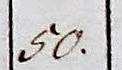50.
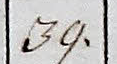39.
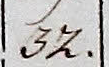32.
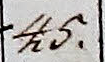45.
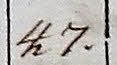47.
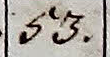53.
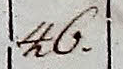46.
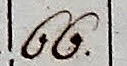66.
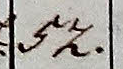52.
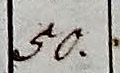50.
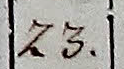23.
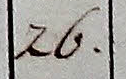26.
